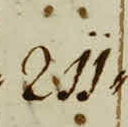211
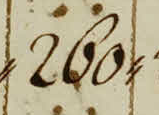260
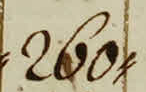260
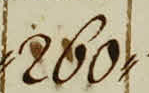260
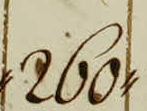260
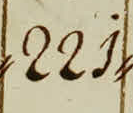221
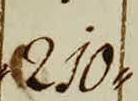210
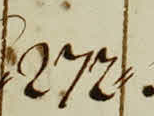272
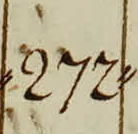272
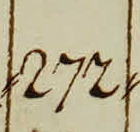272
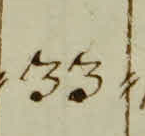33
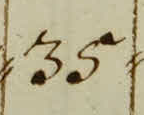35
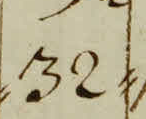32
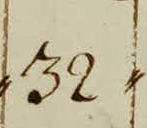32
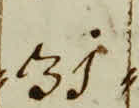31
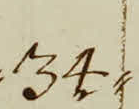34
